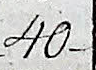40
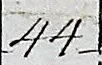44
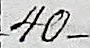40
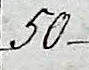50
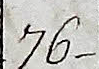76
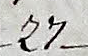27
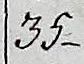35
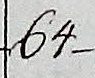64
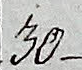30
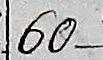60
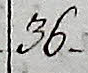36
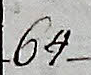64
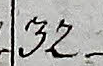32
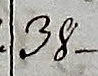38
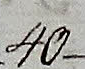40
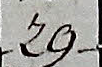29
